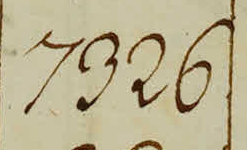7326
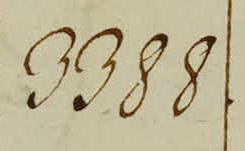3388
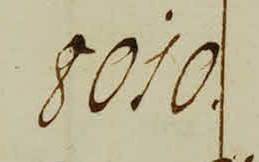8010.
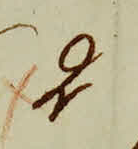2
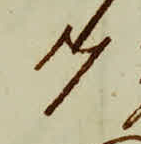7
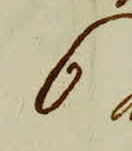6
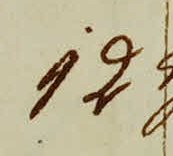12
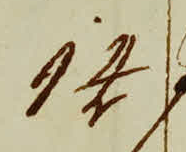14
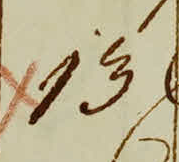13
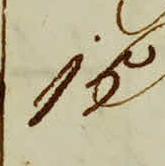15
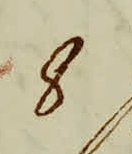8
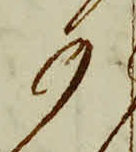9
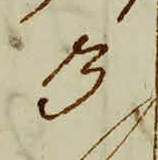3
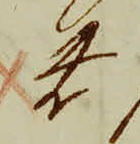4
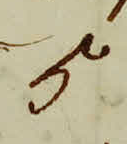5
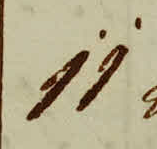11
